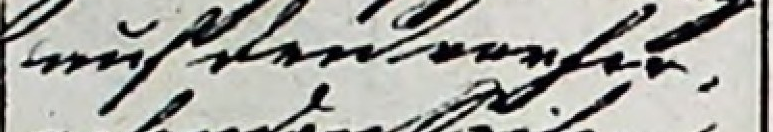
auf den vorher„
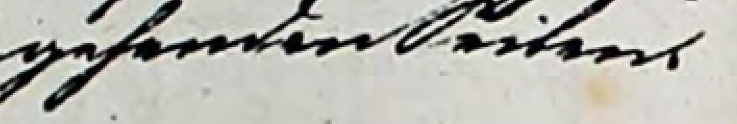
gehenden Seiten
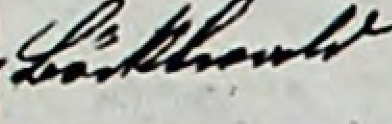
Böcklwald
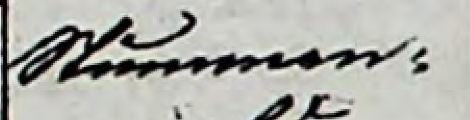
Stummen„
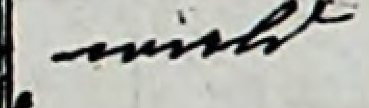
wald
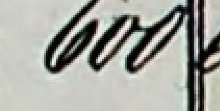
600
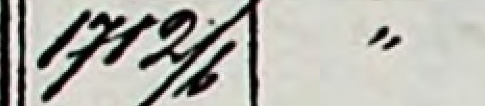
1712/b „
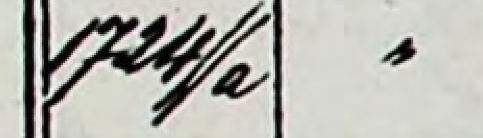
1724/a „
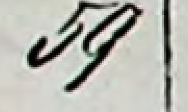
59
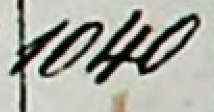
1040
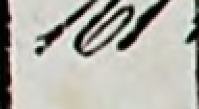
161
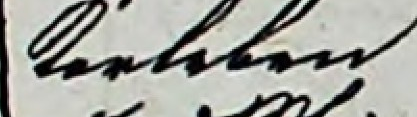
Kerleben
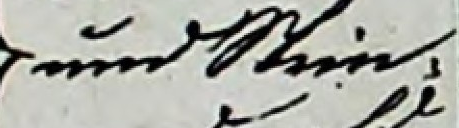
ybd Stein„
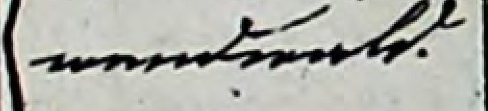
wandwald.
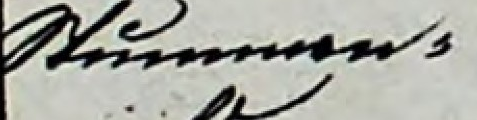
Stummen„
